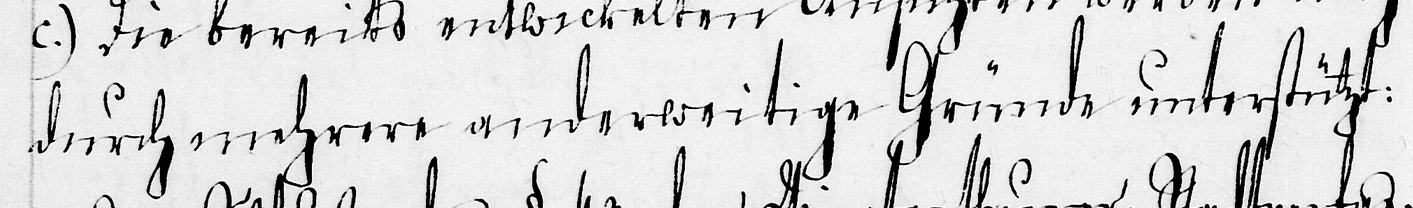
durch mehrere anderweitige Gründe unterstützt:
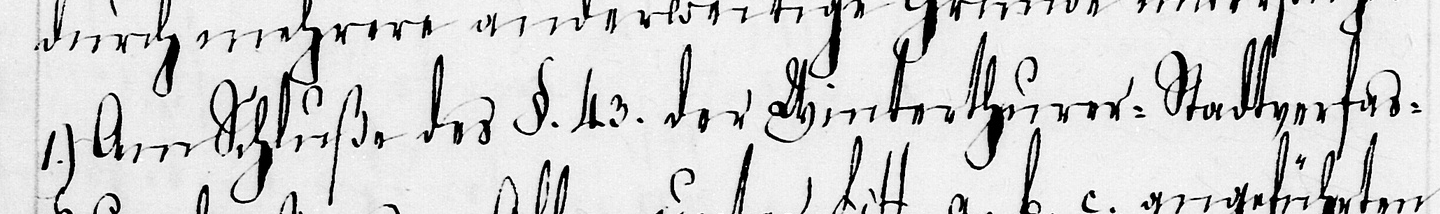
1.) Am Schluße des §. 43. der Winterthurer-Stadtverfaß¬
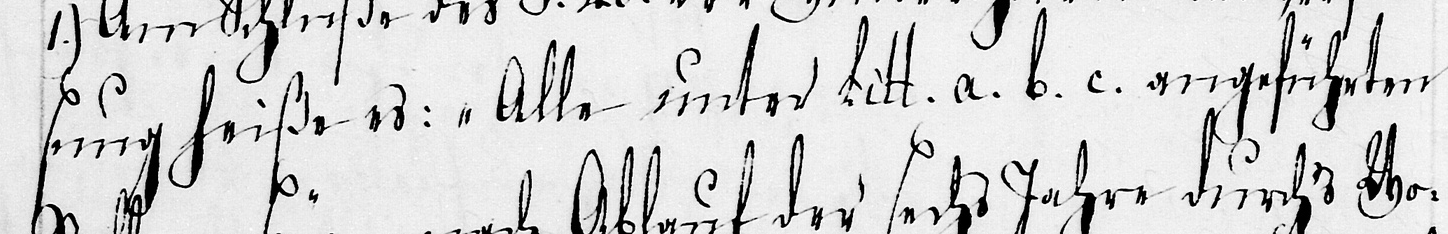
ung heiße es: „Alle unter Litt. a. b. c. angeführten
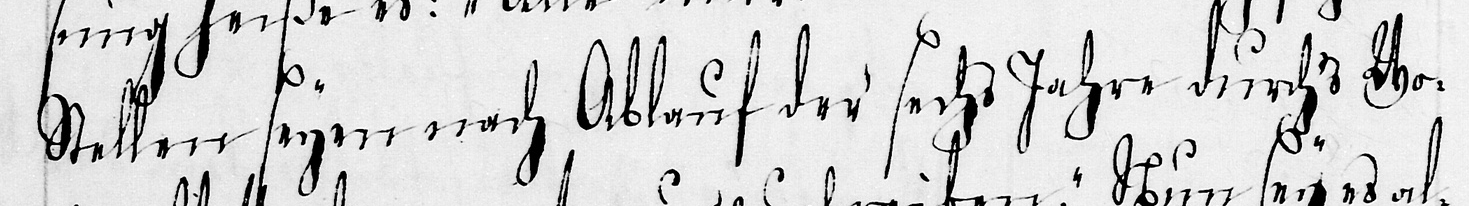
Stellen seyen nach Ablauf der sechs Jahre durch’s Wo¬
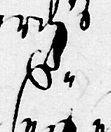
der
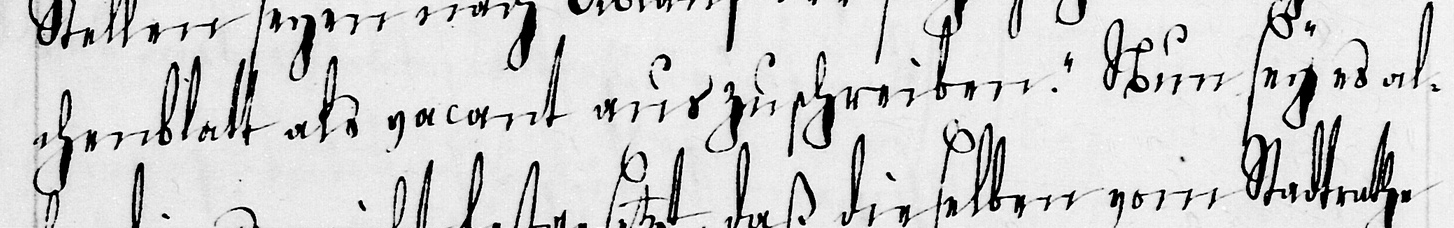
chenblatt als vacant auszuschreiben.“ Nun sey es al¬
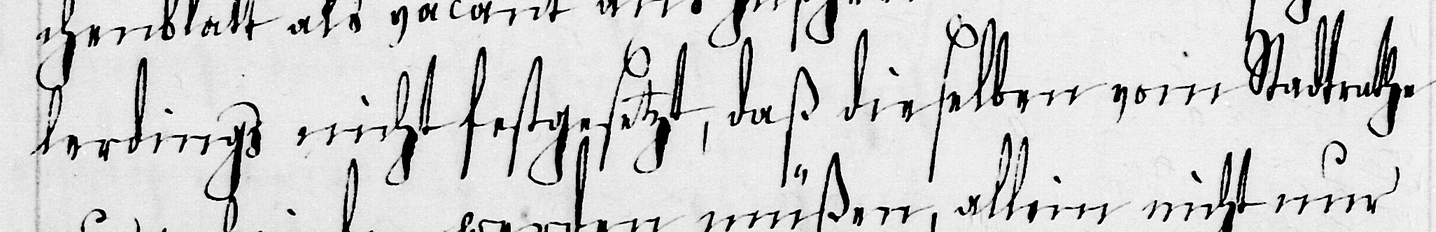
lerdings nicht festgesetzt, daß dieselben vom Stadtrathe
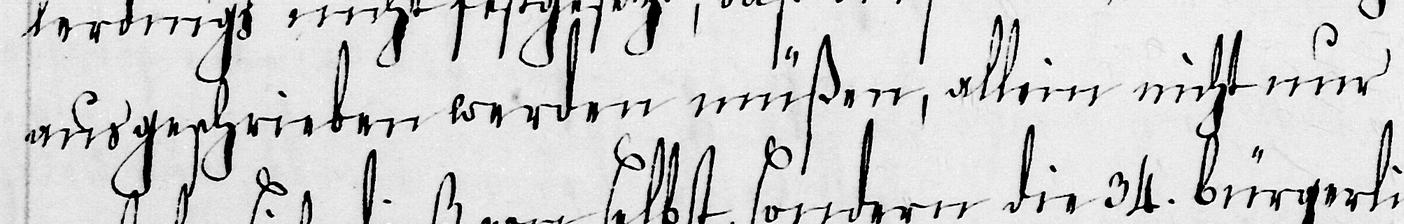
ausgeschrieben werden müßen, allein nicht nur
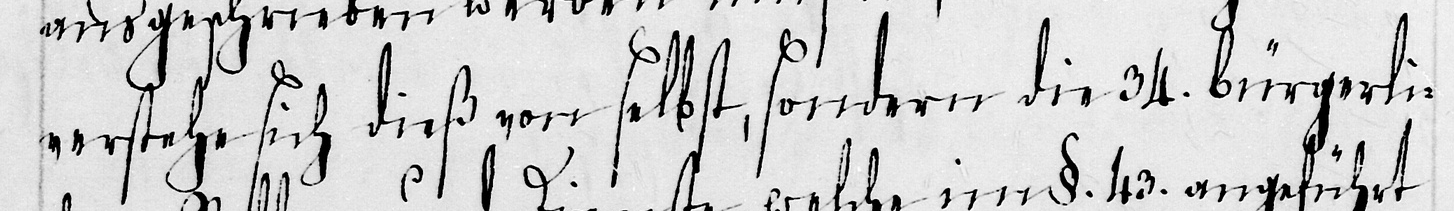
verstehe sich dieß von selbst, sondern die 34. bürgerli¬
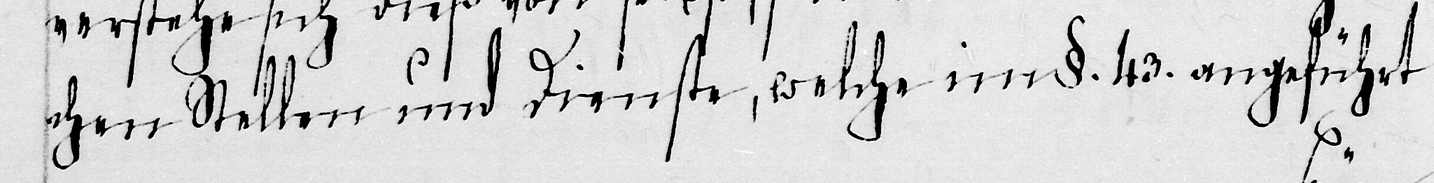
chen Stellen und Dienste, welche im §. 43. angeführt
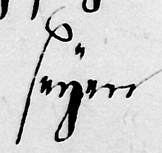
en¬
